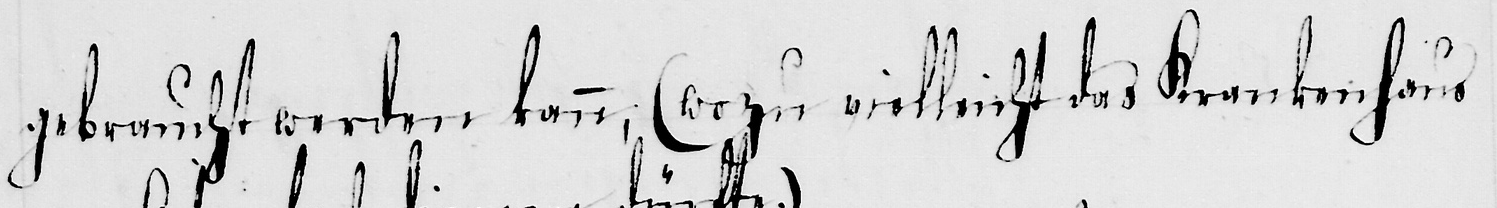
gebraucht werden kann, (wozu vielleicht das Krankenhaus
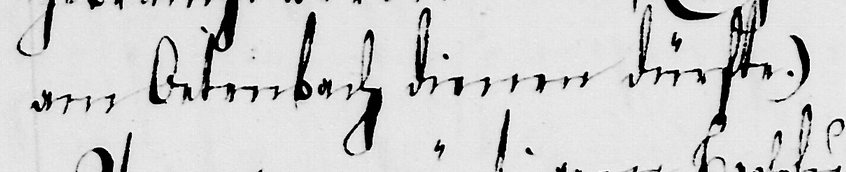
am Oetenbach dienen dürfte.)
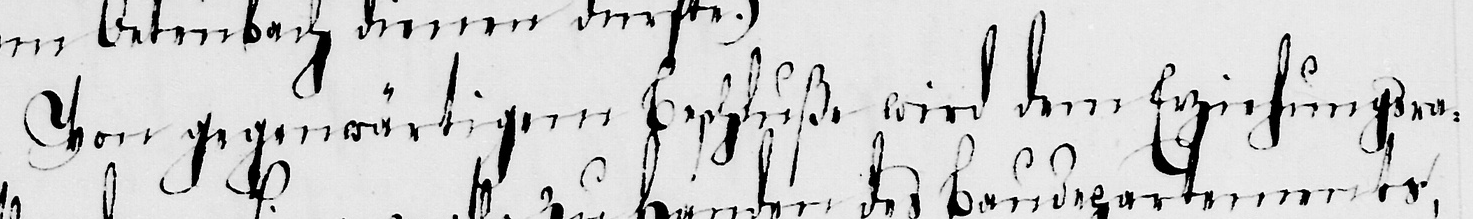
Von gegenwärtigem Beschluße wird dem Erziehungsra¬
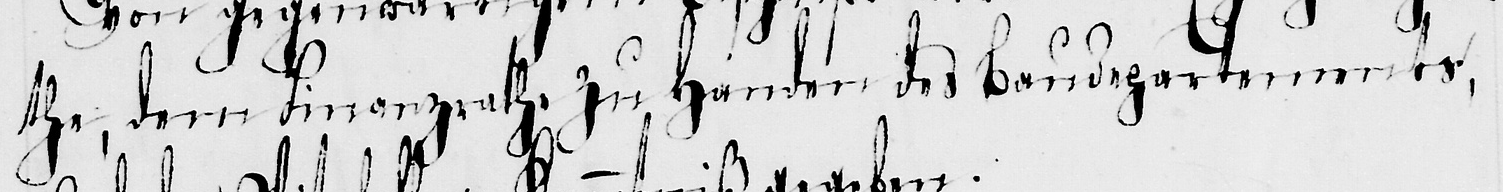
the, dem Finanzrathe zu Handen des Baudepartements,
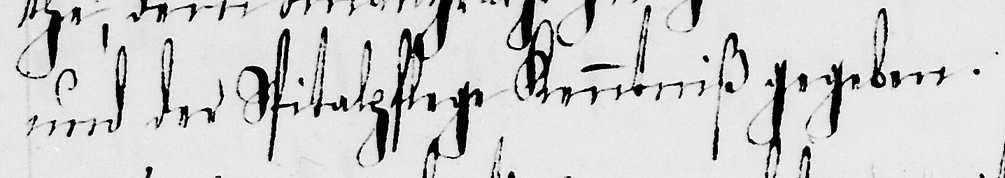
und der Spitalpflege Kenntniß gegeben.
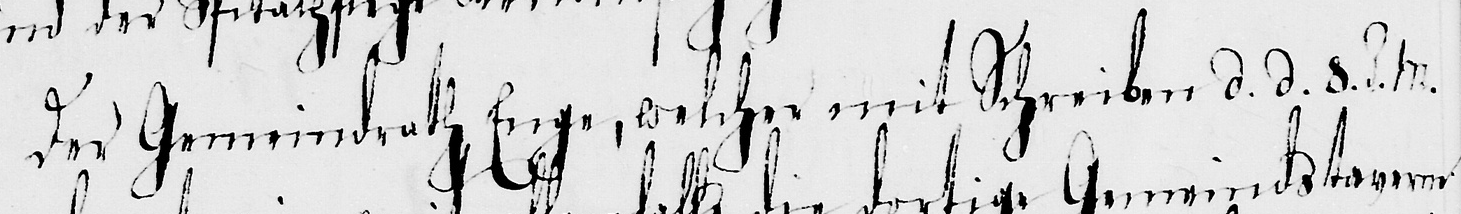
Der Gemeindrath Enge, welcher mit Schreiben d. d. 8. d.
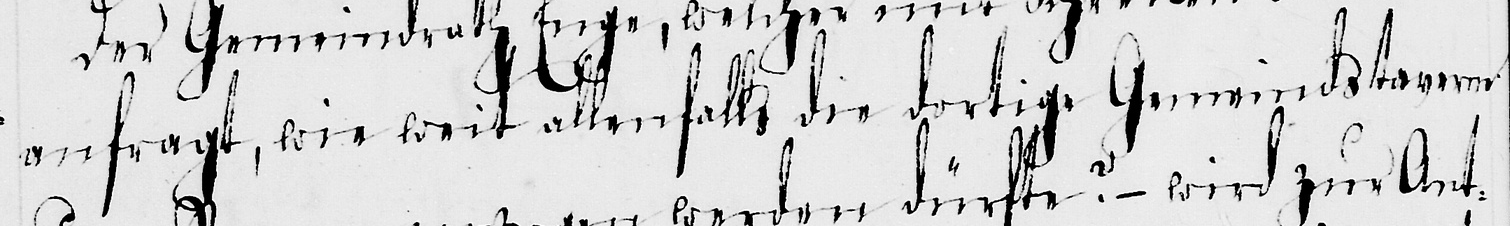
anfragt, wie weit allenfalls die dortige Gemeindstaverne
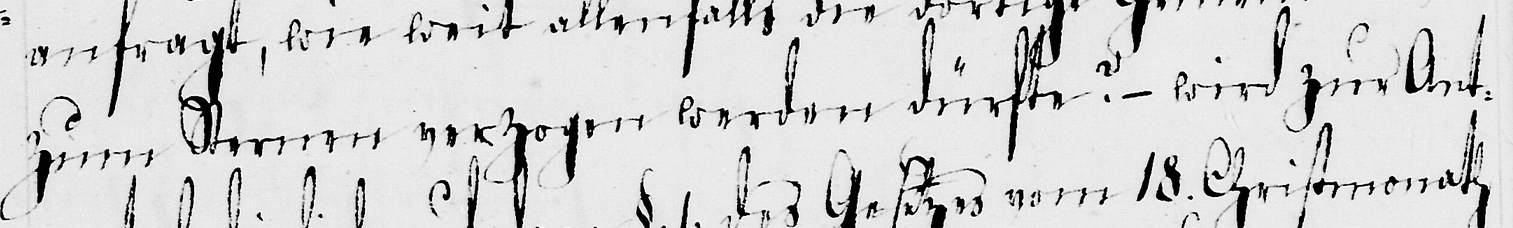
zum Sternen verzogen werden dürfte? – wird zur Ant¬
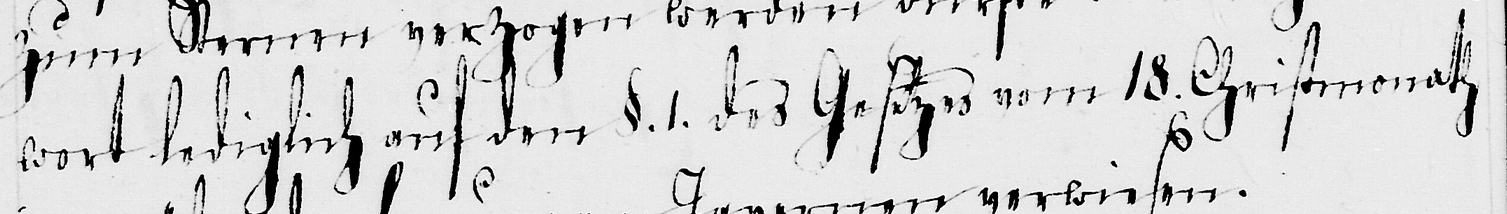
wort lediglich auf den §. 1. des Gesetzes vom 18. Christmonath
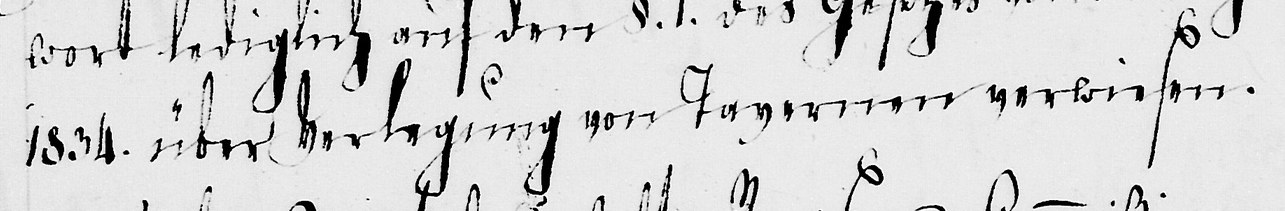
1834. über Verlegung von Tavernen verwiesen.
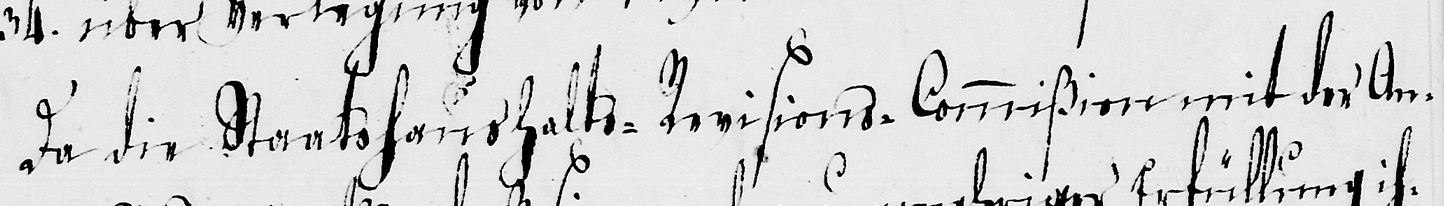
Da die Staatshaushalts-Revisions-Commißion mit der An¬
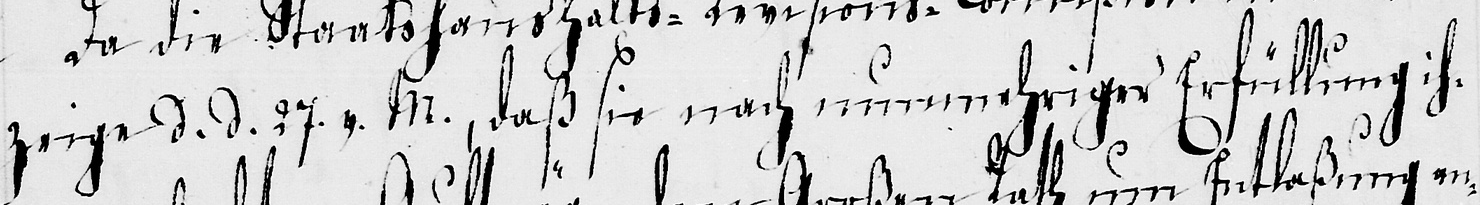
zeige d. d. 27. v. M., daß sie nach nunmehriger Erfüllung ih¬
